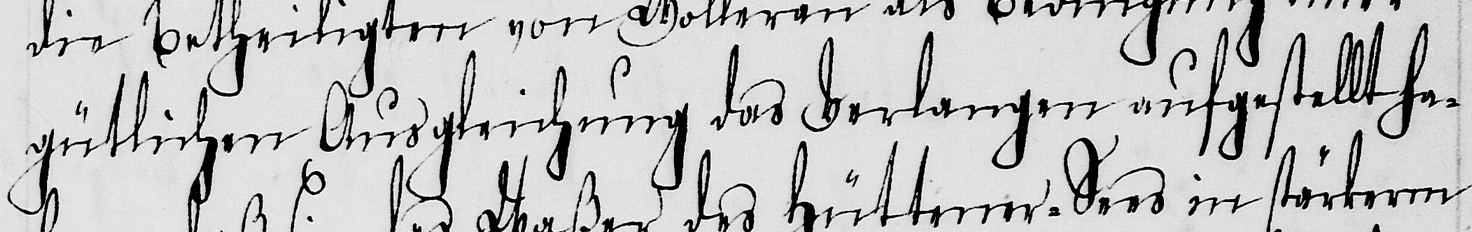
gütlichen Ausgleichung das Verlangen aufgestellt h¬
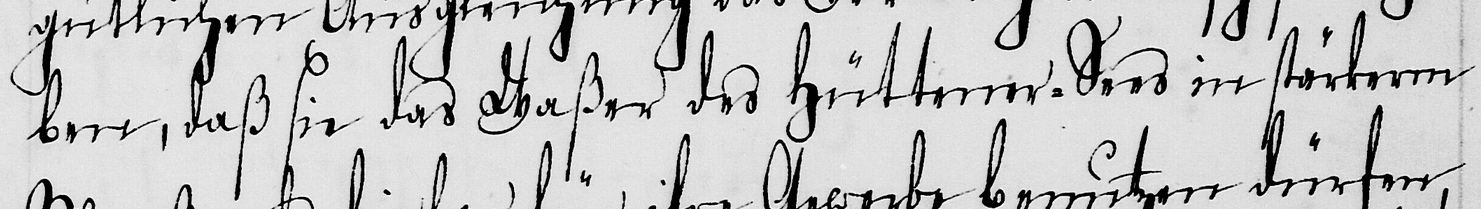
aben, daß sie das Waßer des Hüttener-Sees in stärkerm
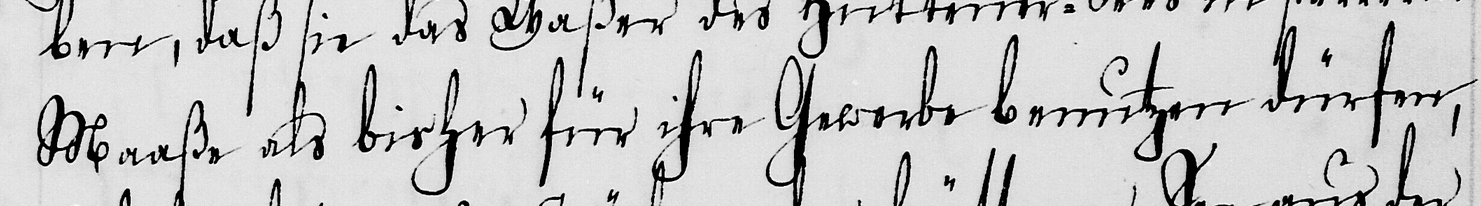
Maaße als bisher für ihre Gewerbe benutzen dürfen,
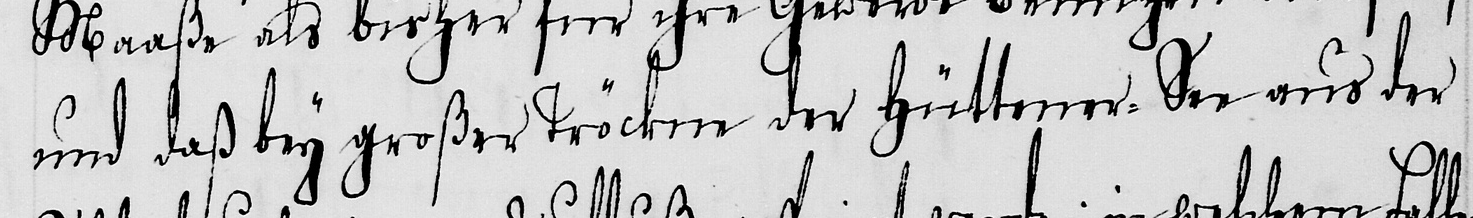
und daß bey großer Tröckne der Hüttener-See aus der
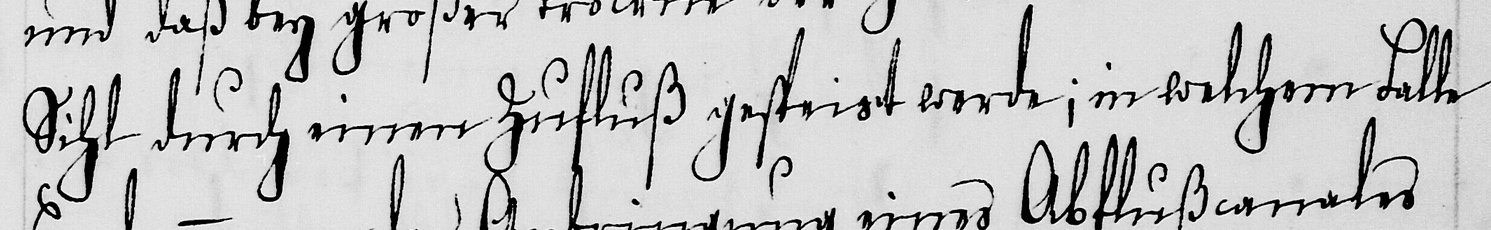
Sihl durch einen Zufluß gespeist werde; in welchem Falle
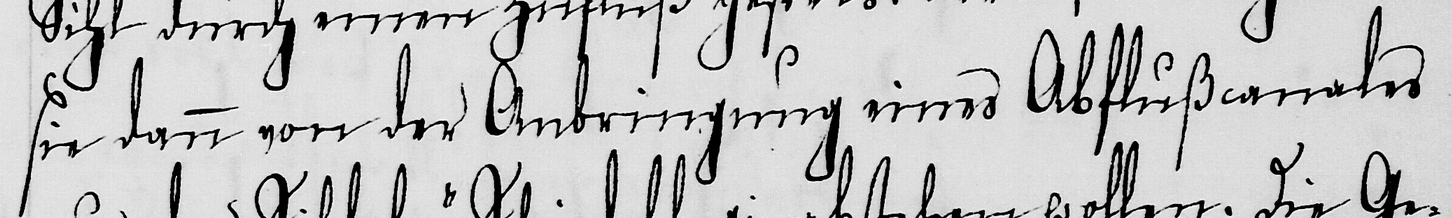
sie dann von der Anbringung eines Abflußcanales
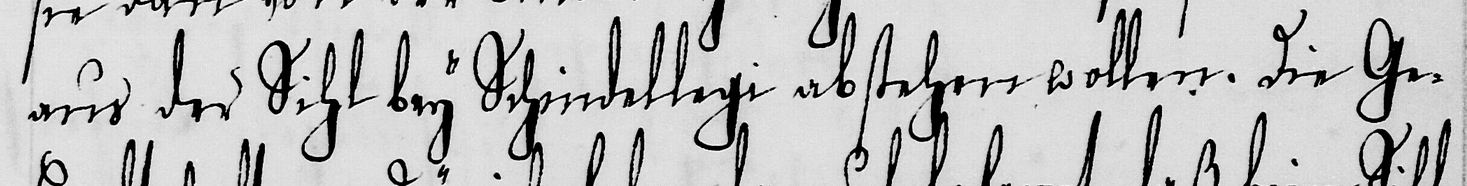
aus der Sihl bey Schindellegi abstehen wollen. Die Ge¬
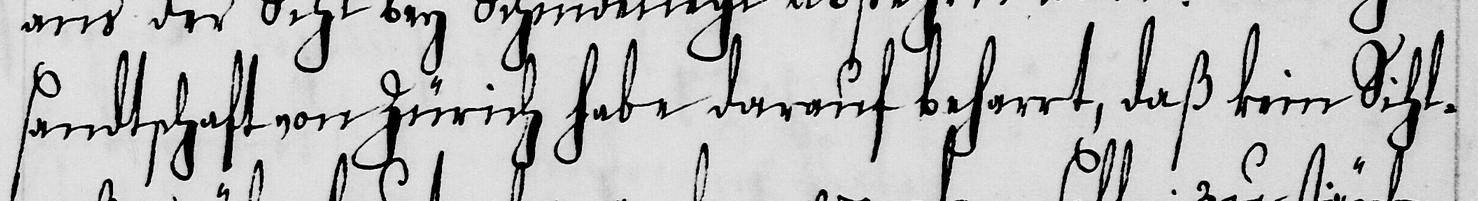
sandtschaft von Zürich habe darauf beharrt, daß kein Sihl¬
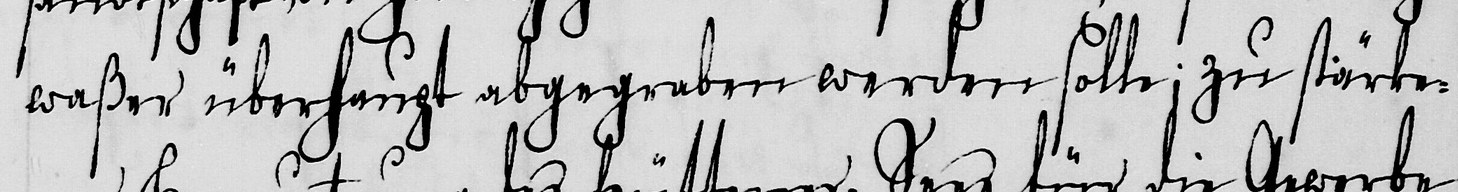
waßer überhaupt abgegraben werden solle; zu stärke¬
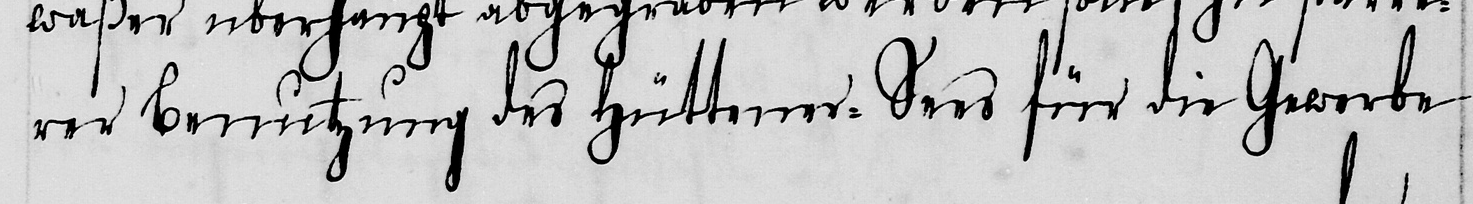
rer Benutzung des Hüttener-Sees für die Gewerbe
